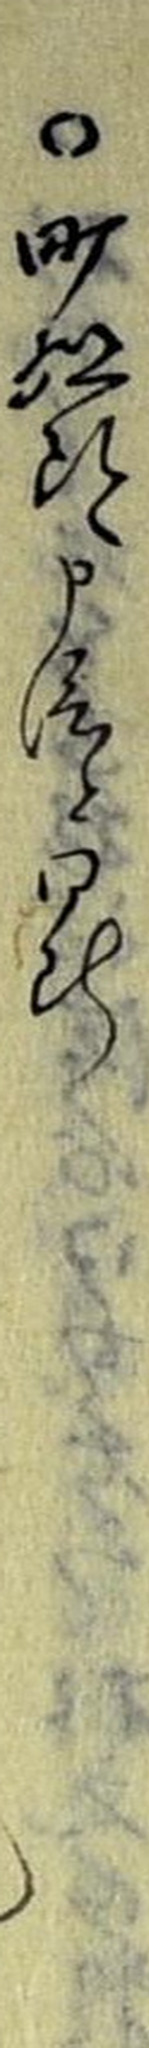〇町組頭へ申渡と同断
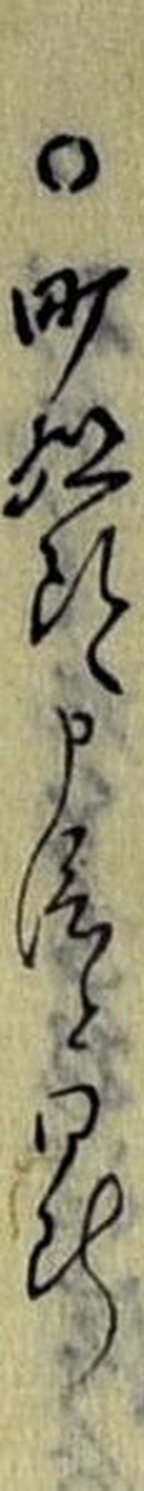〇町組頭へ申渡と同断
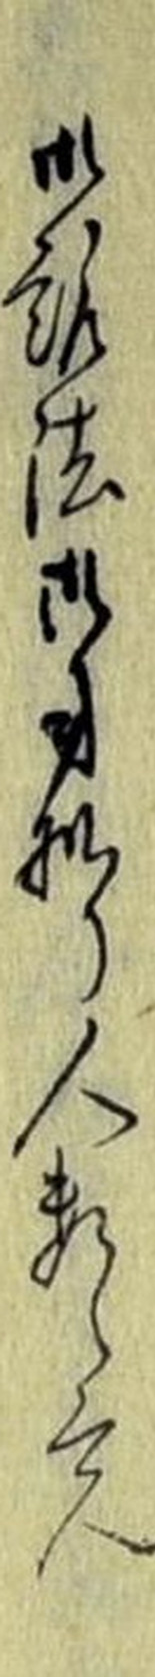御趣法御用掛り人数之覚
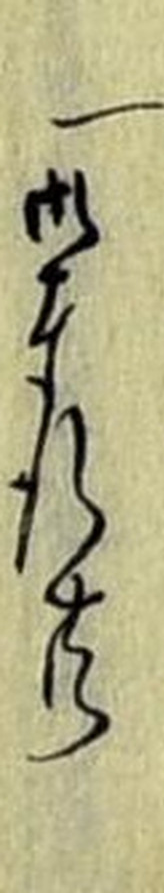御奉行共
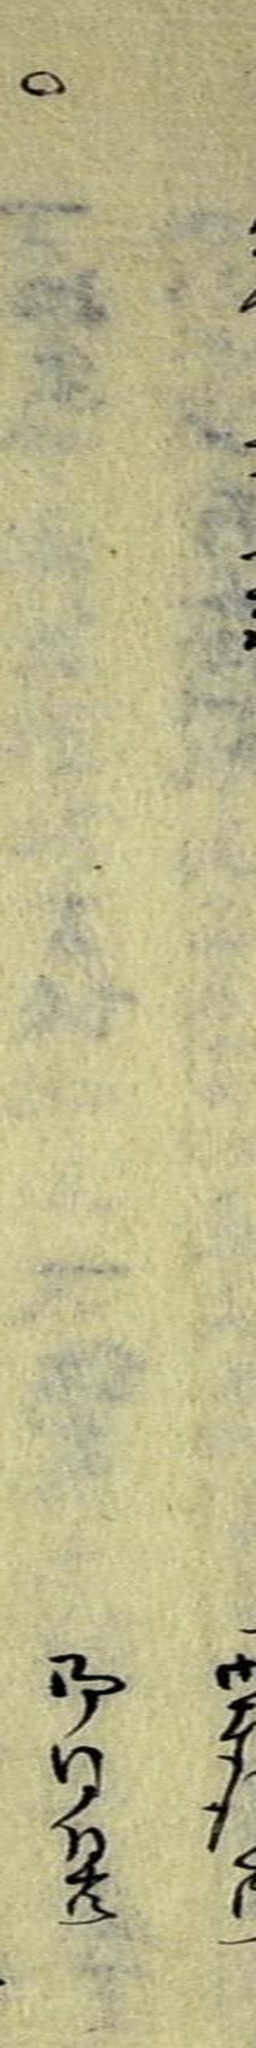〇御目付共
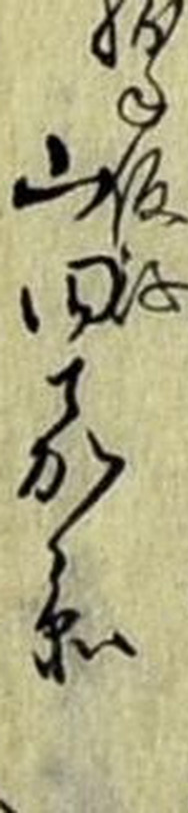山田嘉兵衛
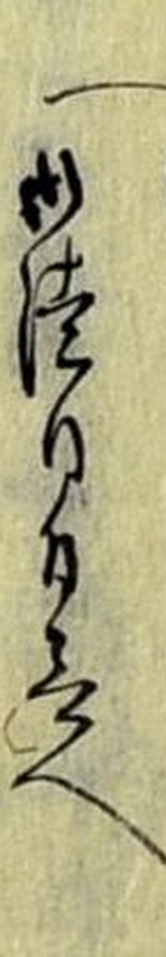御徒目付壱人

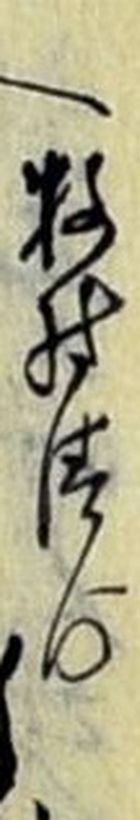牧村五郎右衛門
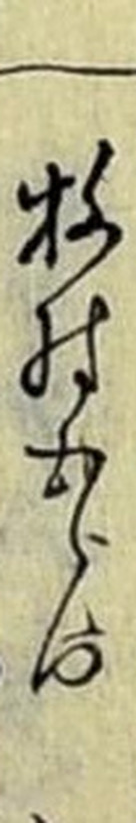牧村五郎右衛門
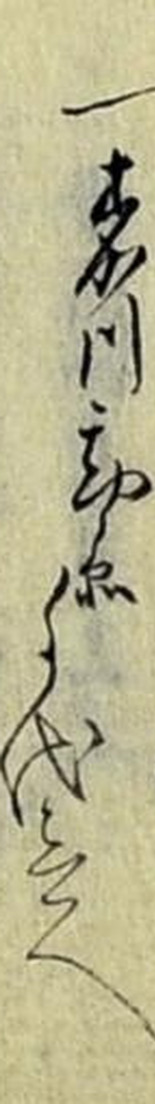森川勘兵衛
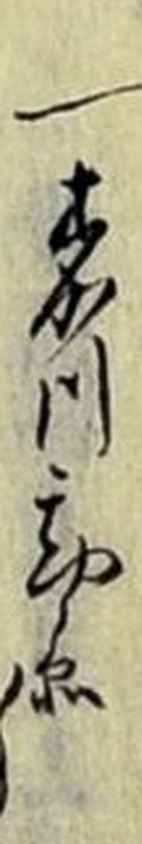森川勘兵衛
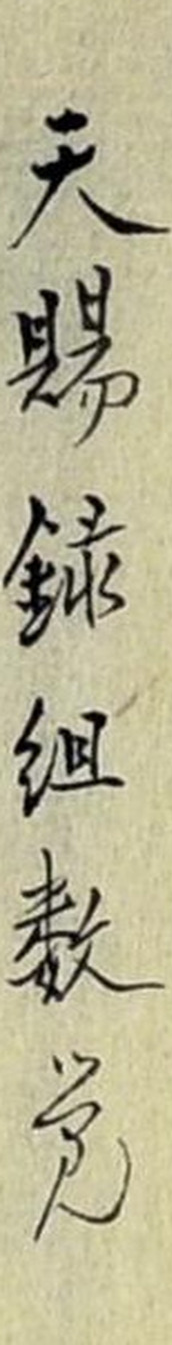天賜録組数覚
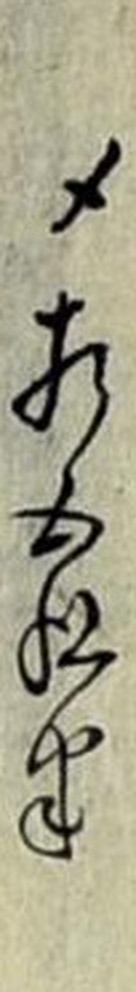〆拾五組半
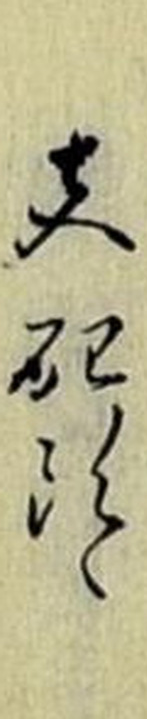支配頭へ
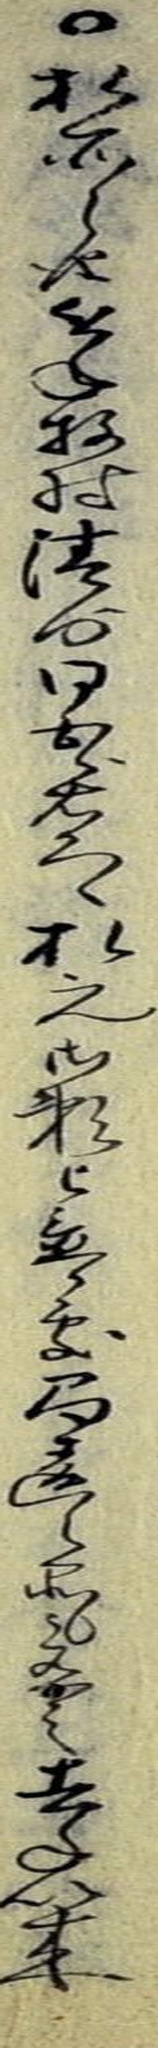〇札所之儀近年牧村清右衛門同五郎右衛門へ札元御頼被置候処間違之品も有之去年以来
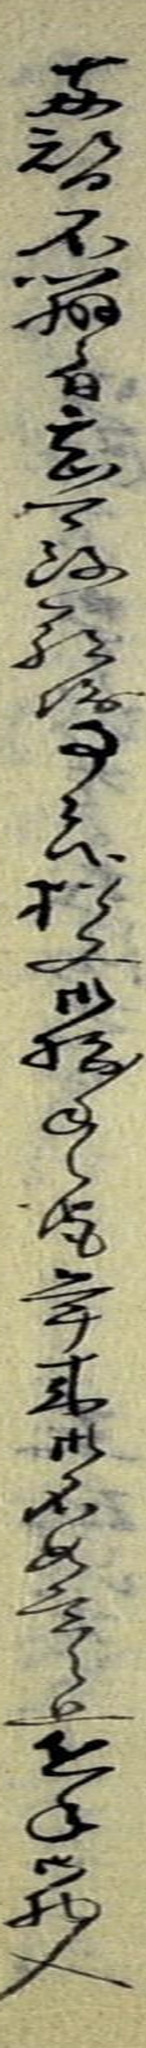両替不弁に付甚可致難儀事に候猶又御勝手之儀も年来御不如意之上近年御物入
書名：命令之部 二
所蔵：福井県文書館 Fukui Prefectural Archives
